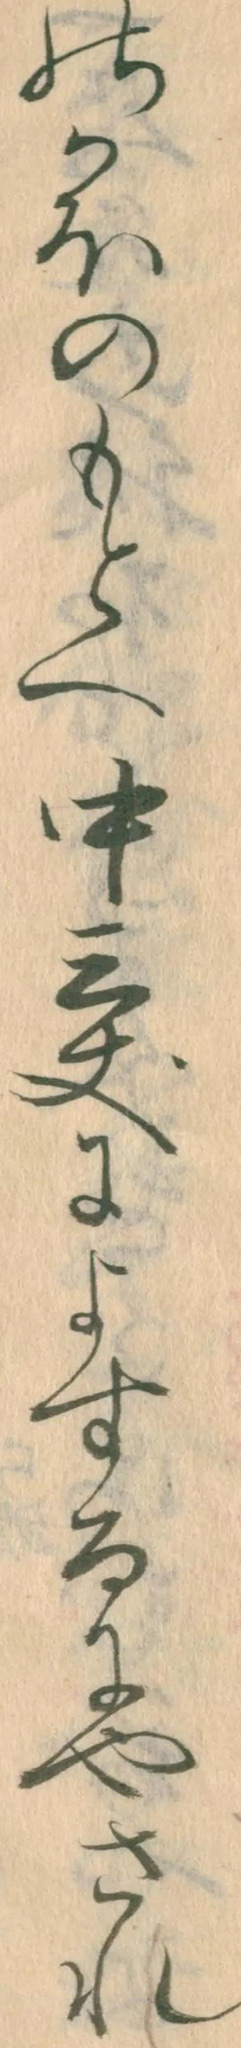のかほのもとへ中三丈によするにやされ
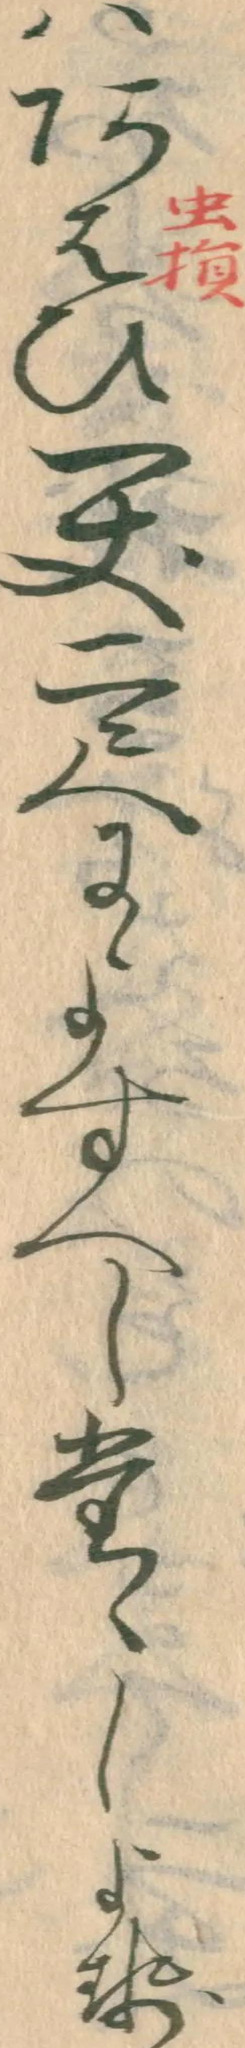はあはひ一丈二尺によすへしたゝしよせ
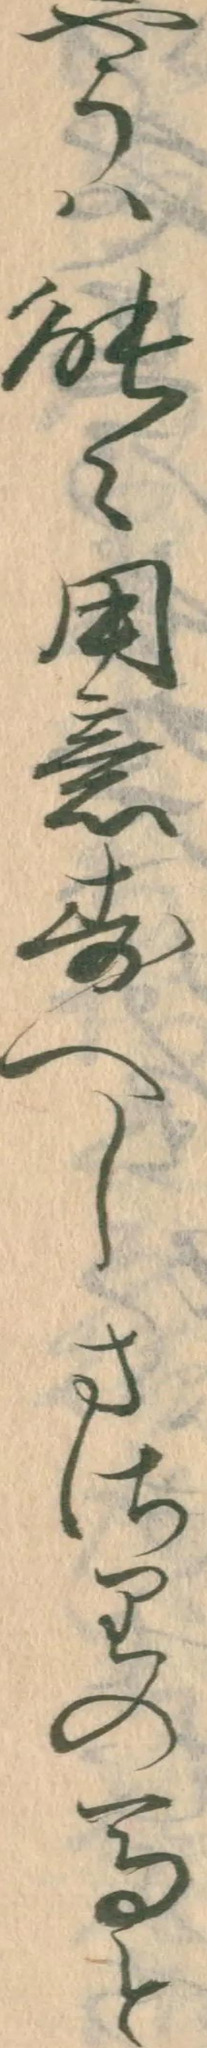やうは能々用意すへしまさりの馬と
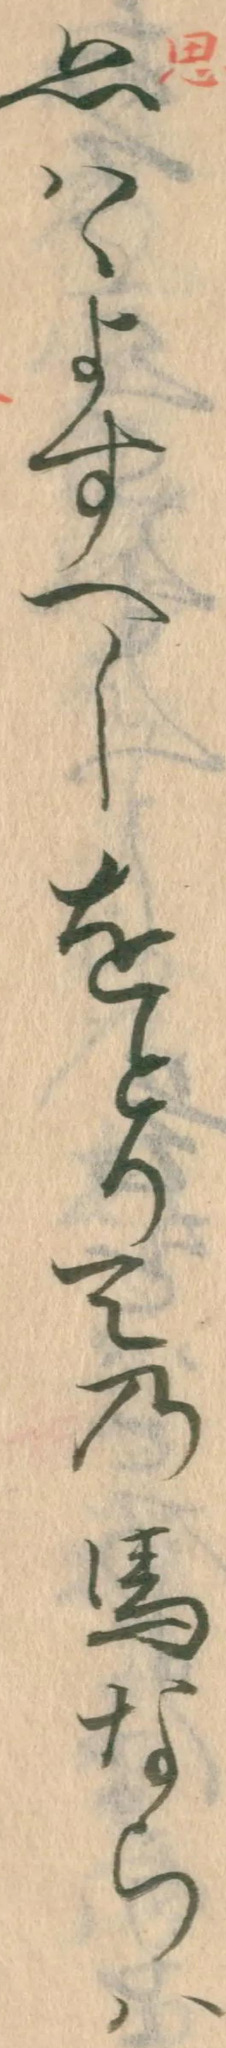思はゝよすへしをとりての馬ならは
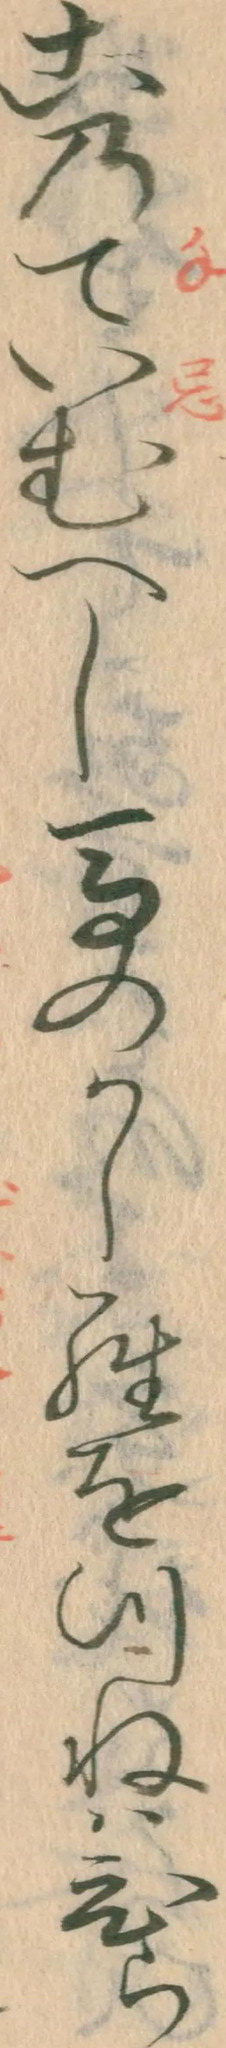このていむへし馬のかしらをつねはひら
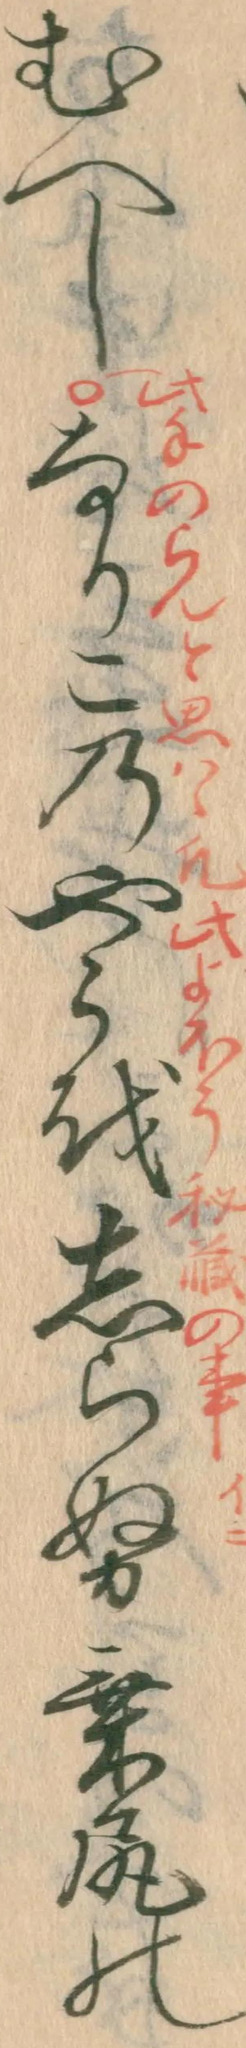むへし◦なりこのやうをしらぬ乗尻の
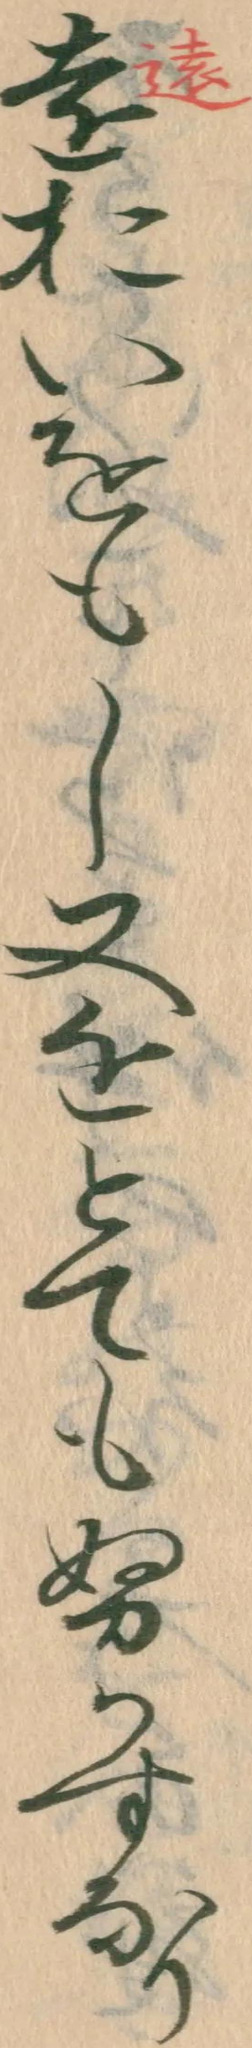遠おいをもし又近とてもぬかすなり
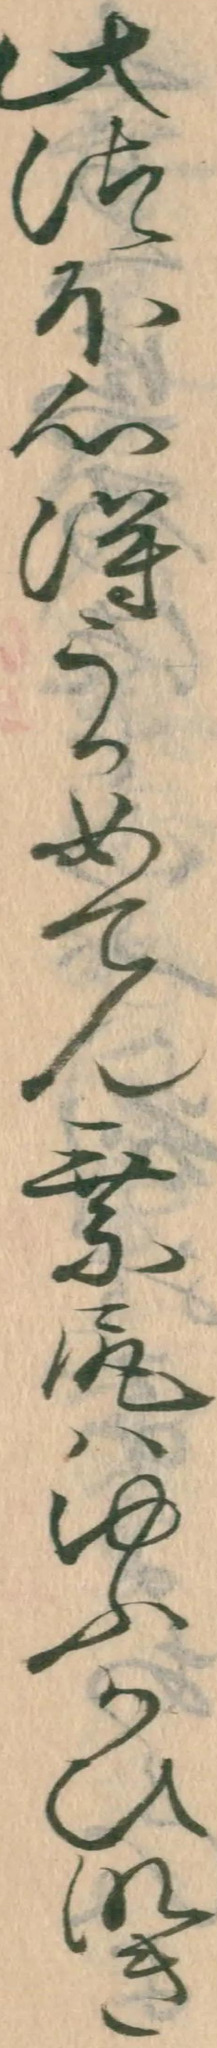大つほ心得うかめてん乗尻はゆふかひなき
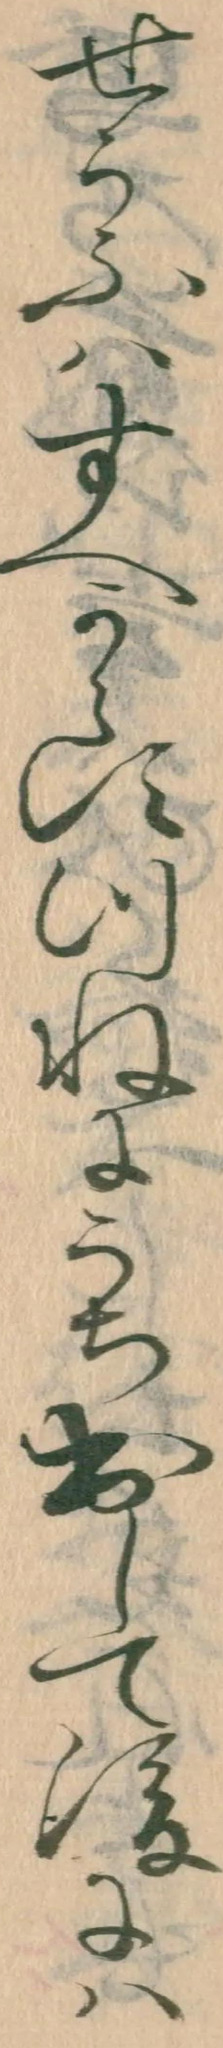せうふはすへからすつねにうち出して後には
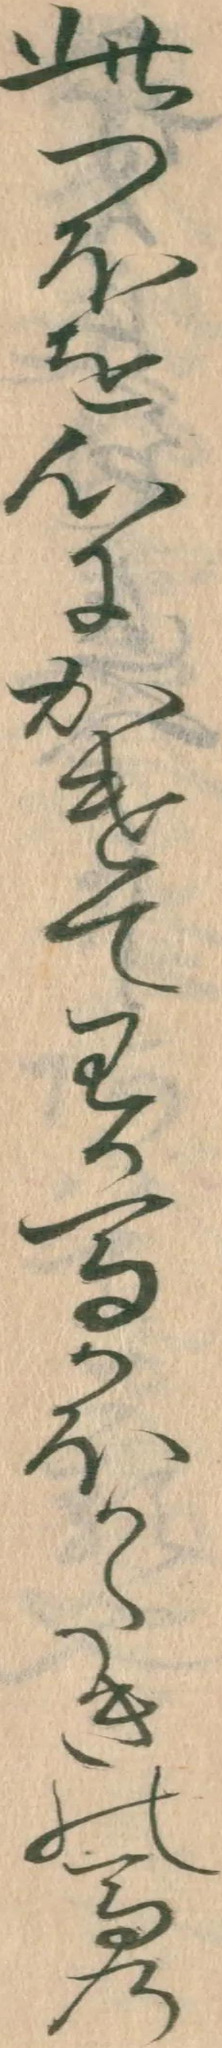此つほを心にかけてわか馬かほかたきの馬の
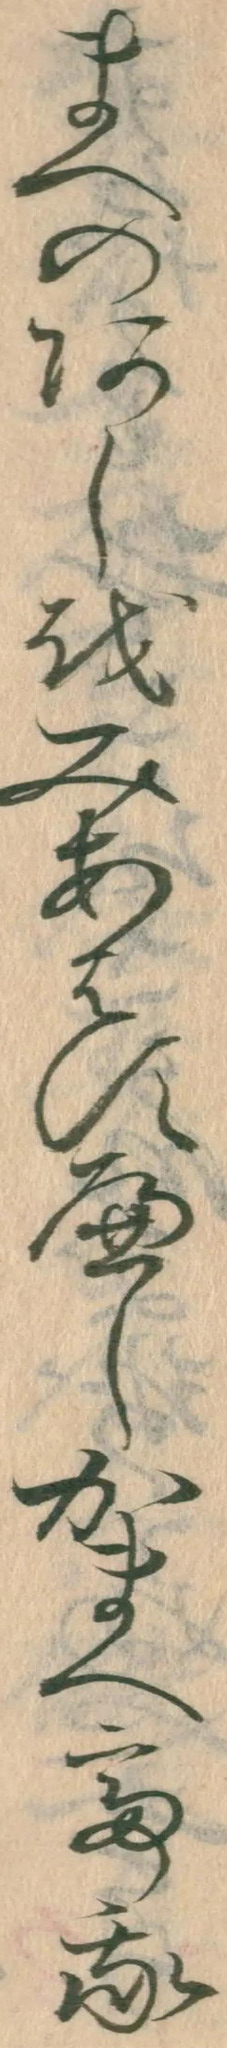まへのあしをみあはすへしかまへて我
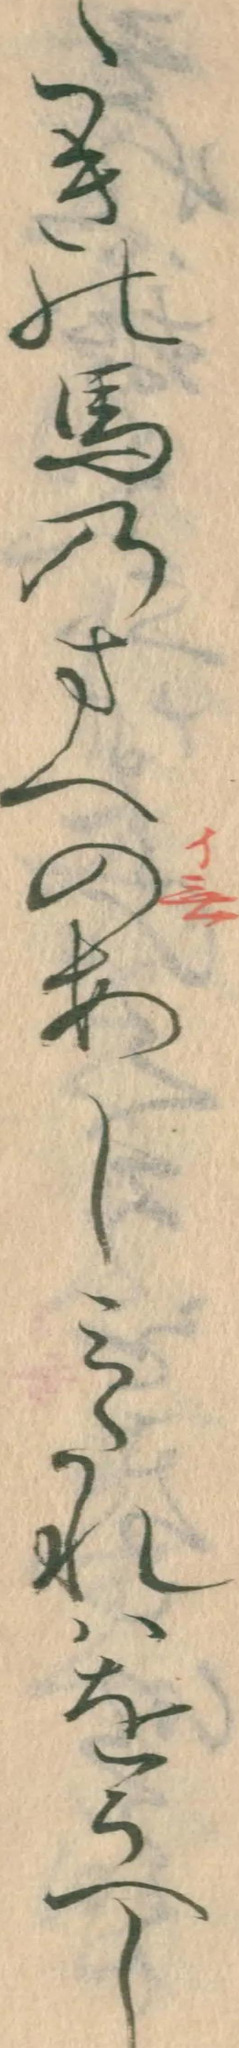たきの馬のまへのあしみたれはをうへし
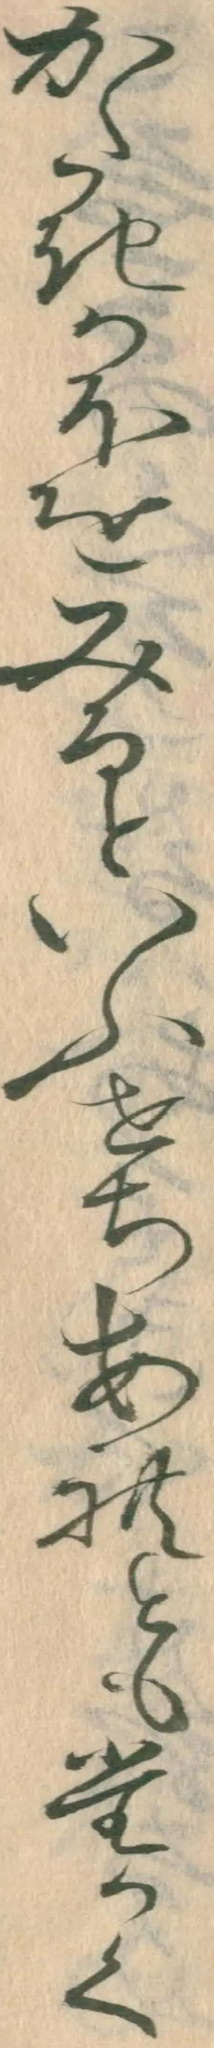かたきかほをみるといふせちあれともたかく
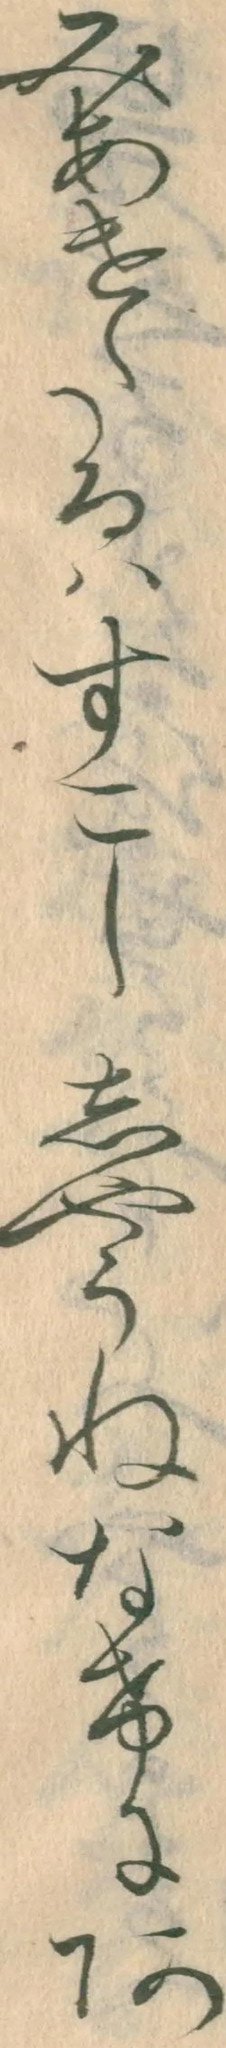みあけたるはすこししやうねなけにあ
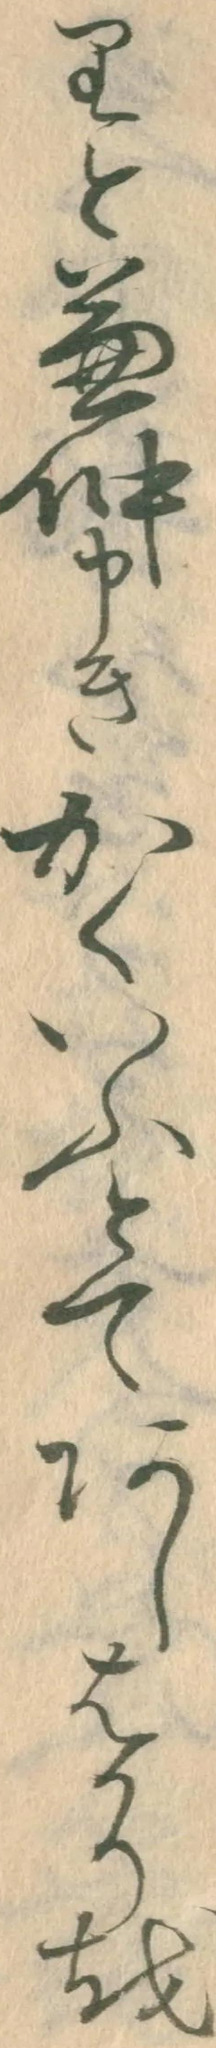りと兼仲申きかくいふとてあしはかりを
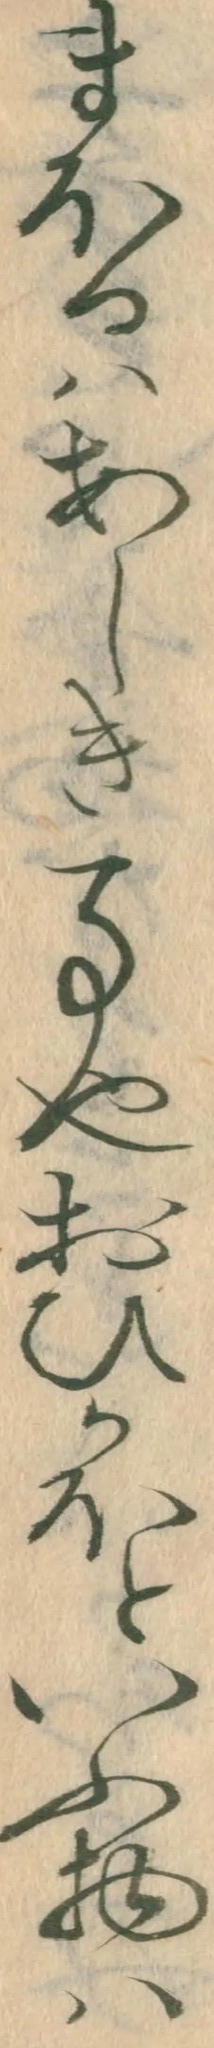まほるはあしき事也おひかほといふ物は
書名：賀茂社記録. 第13冊
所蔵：国立国会図書館 National Diet Library, JAPAN
